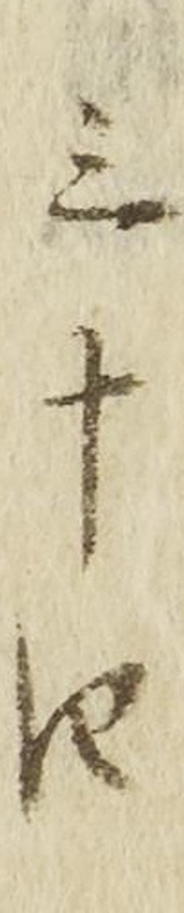三十四

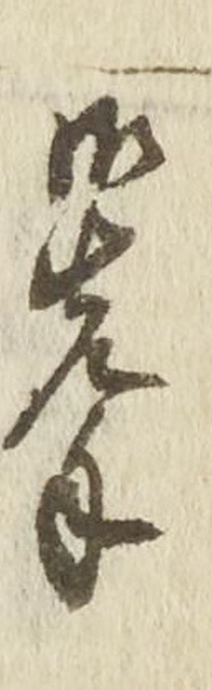御先手
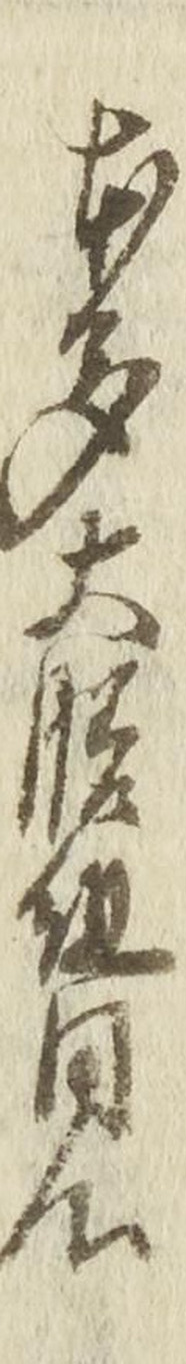本多大膳組同心
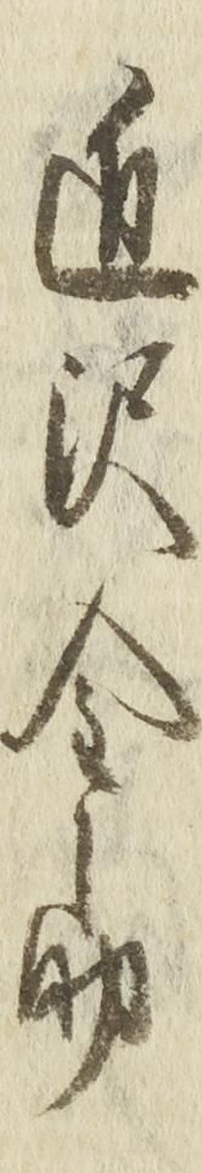近沢金之助
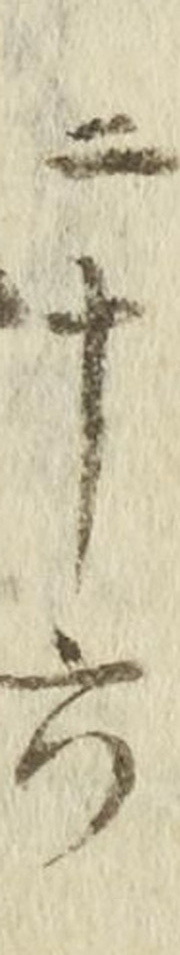二十六
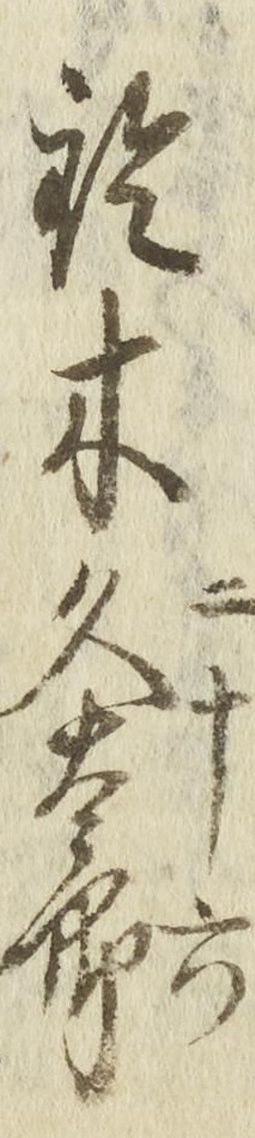鈴木久太郎
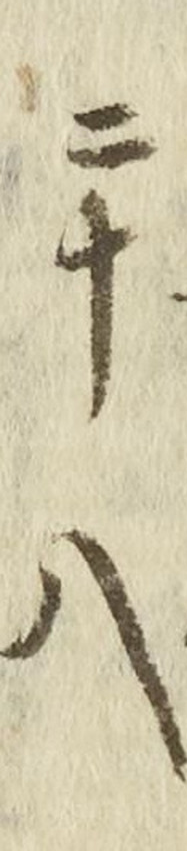二十八
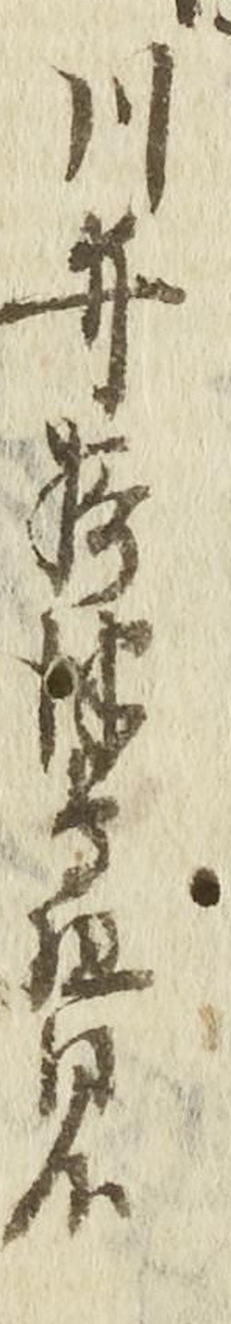川井摂津守組同心
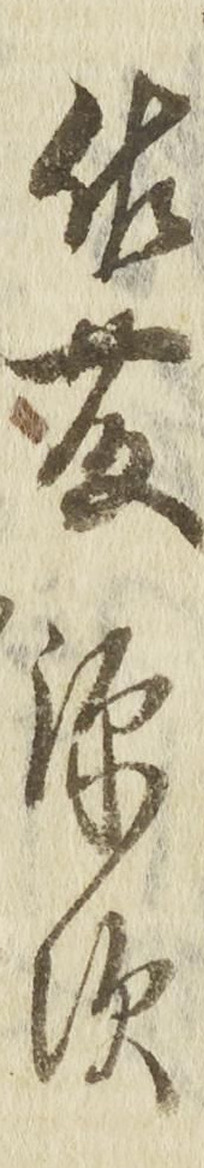佐藤源次
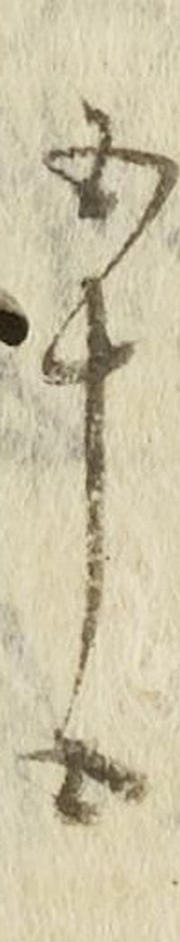五十五
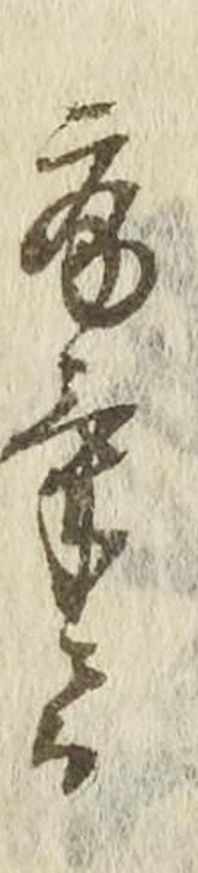病気二而
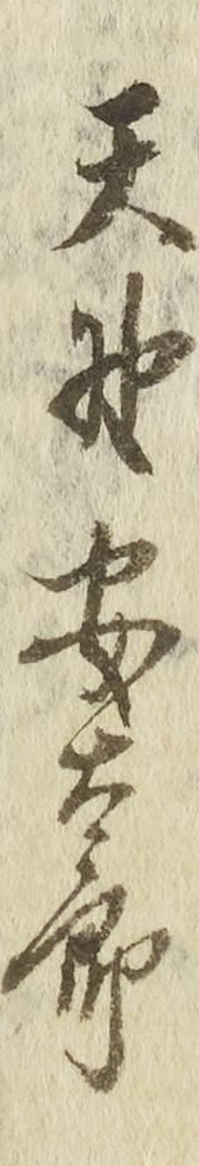天野安太郎
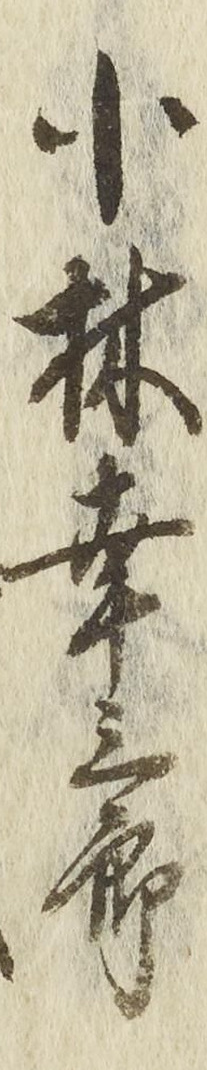小林幸三郎
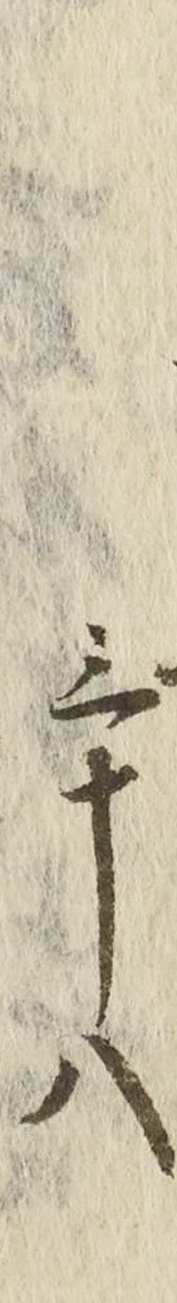三十八
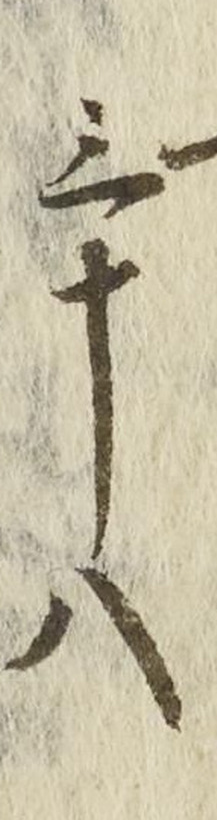三十八
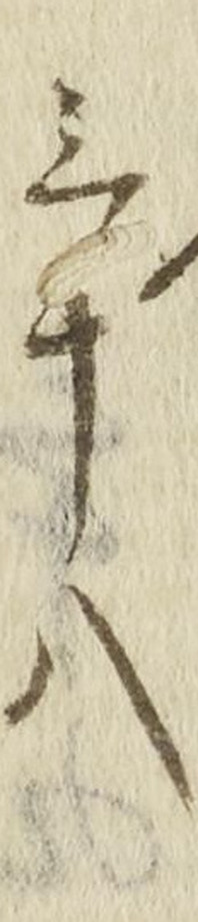三十八
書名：世説ヤンレフシ写、駿州田中城地震ニ付内外破損御届書、豫州大洲城地震ニ付内外破損御届書・封廻状
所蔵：東京大学地震研究所図書室 Earthquake Research Institute Library, The University of Tokyo, JAPAN
